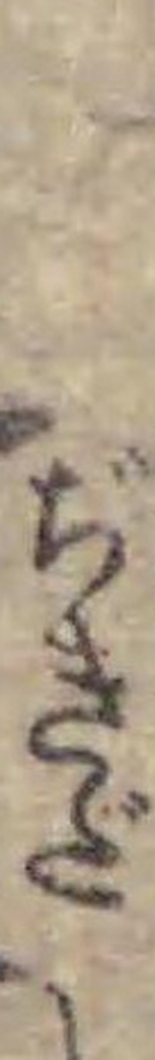ぢきだ
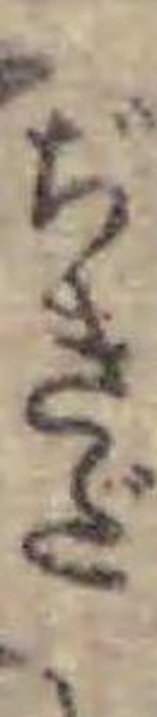ぢきだ
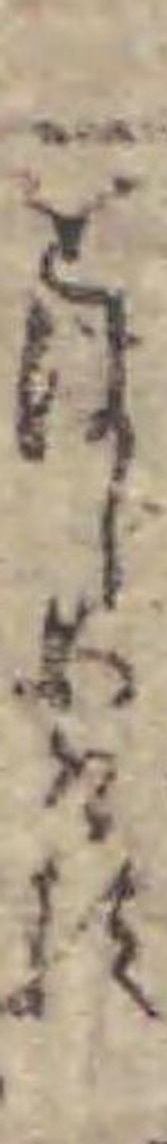をはじめける
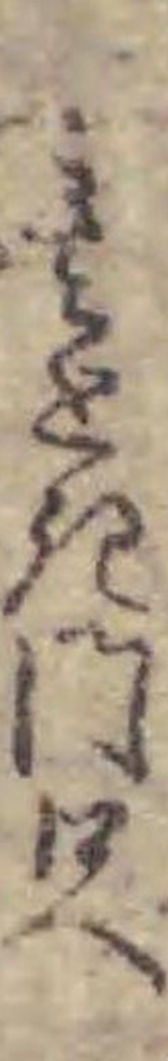壱とき門口へ
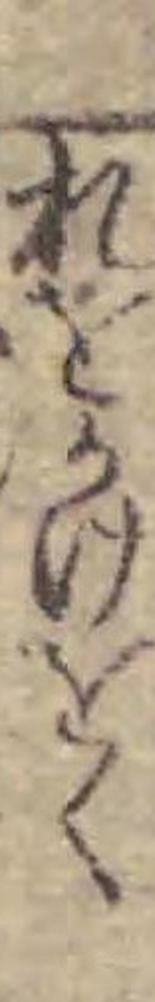札をかけをく
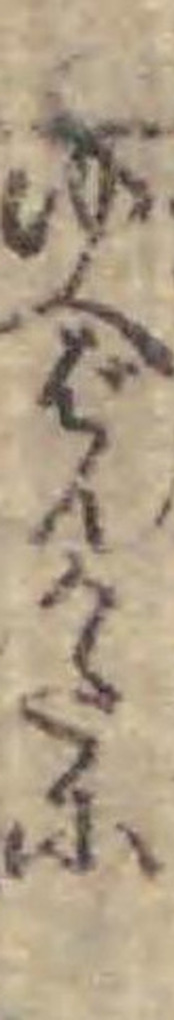ゆへばんかたに
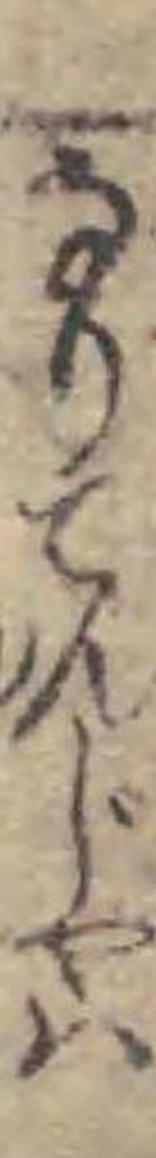なりてんじやは
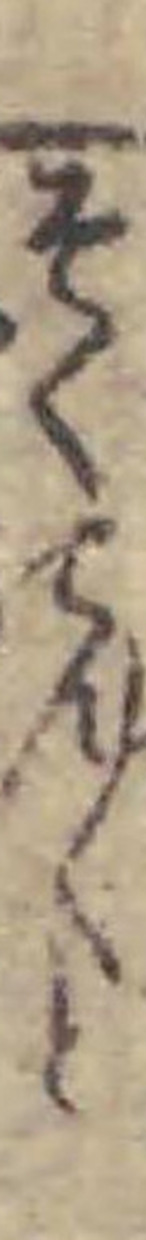そくてん〳〵と
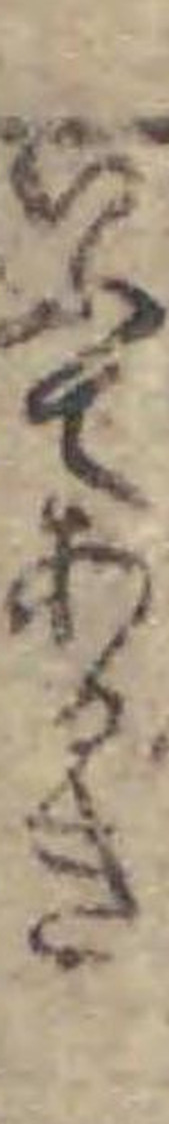いふてあるき
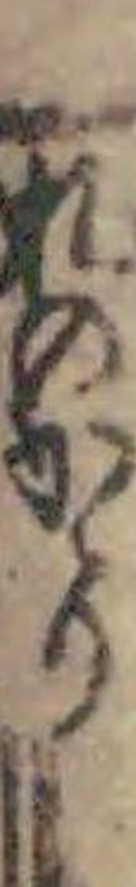札のかゝり
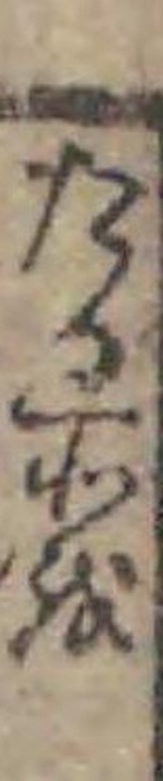たる所を
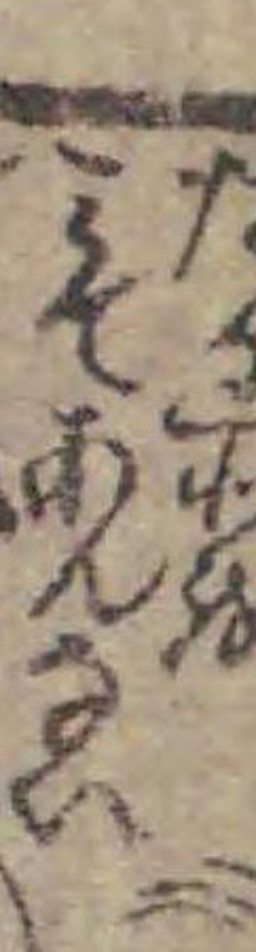みてあんない
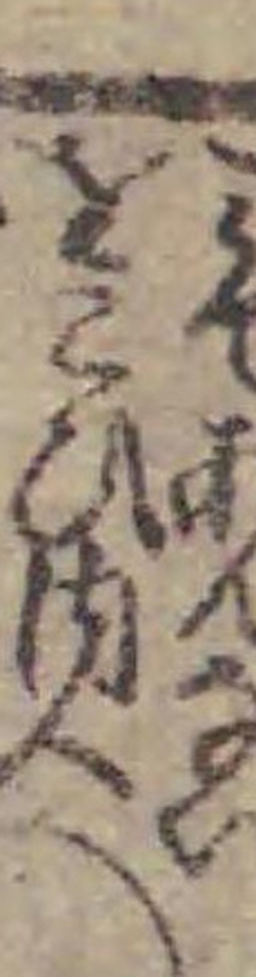をこひ内へ
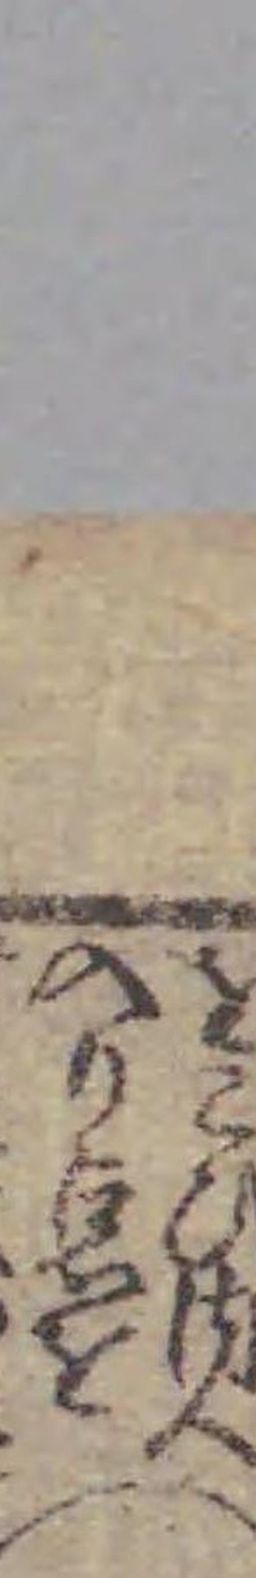入り点を
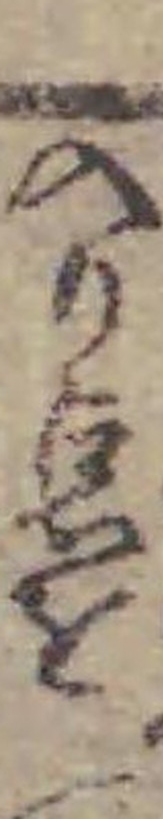入り点を
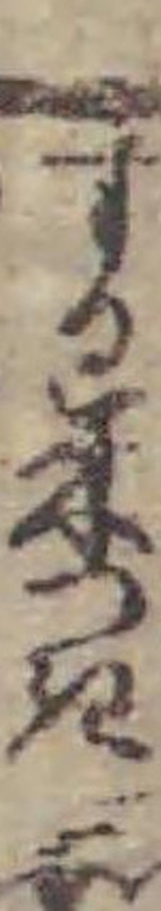する米つき
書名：本樹真猿浮気噺 : 3巻
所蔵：国立国会図書館 National Diet Library, JAPAN
